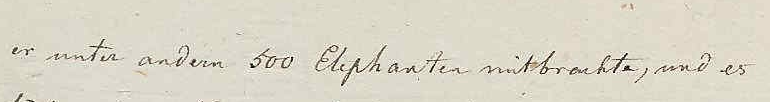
er unter andern 500 Elephanten mitbrachte, und es
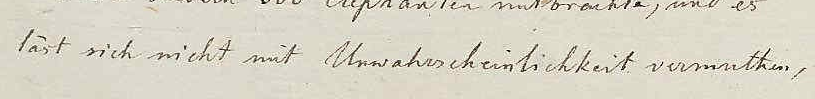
läst sich nicht mit Unwahrscheinlichkeit vermuthen,
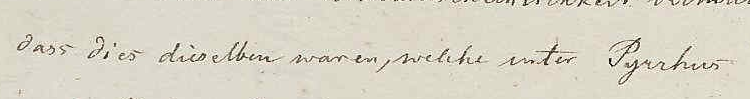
dass dies dieselben waren, welche unter Pyrrhus
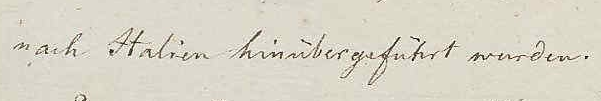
nach Italien hinübergeführt wurden.
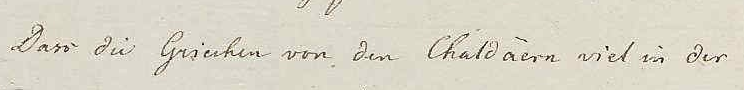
Dass die Griechen von den Chaldäern viel in der
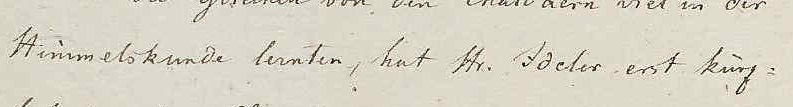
Himmelskunde lernten, hat Hr. Ideler erst kürz-
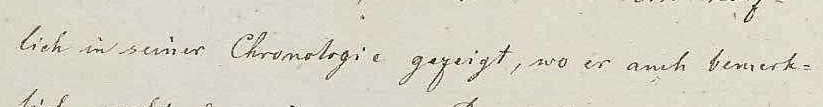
lich in seiner Chronologie gezeigt, wo er auch bemerk-
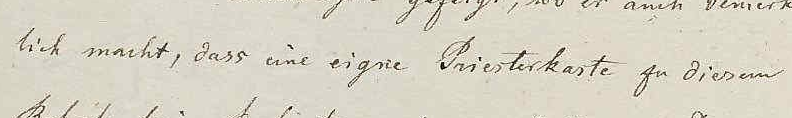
lich macht, dass eine eigne Priesterkarte zu diesem
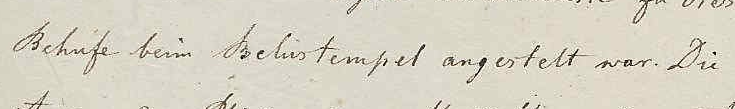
Behufe beim Belustempel angestelt war. Die
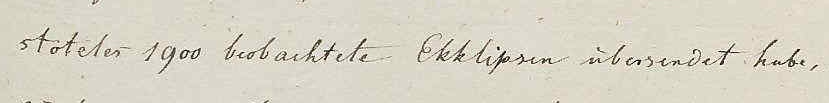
stoteles 1900 beobachtete Ekklipsen übersendet habe,
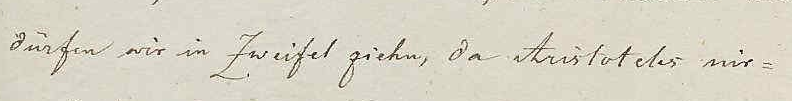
dürfen wir in Zweifel ziehn, da Aristoteles nir-
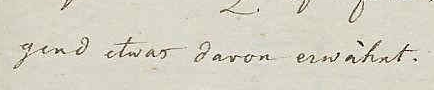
gend etwas davon erwähnt.
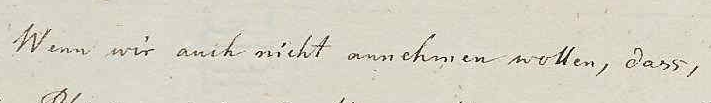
Wenn wir auch nicht annehmen wollen, dass,
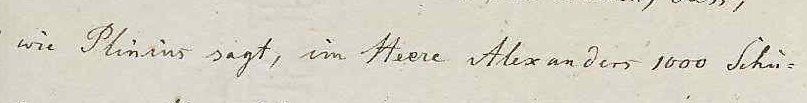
wie Plinius sagt, im Heere Alexanders 1000 Schü-
